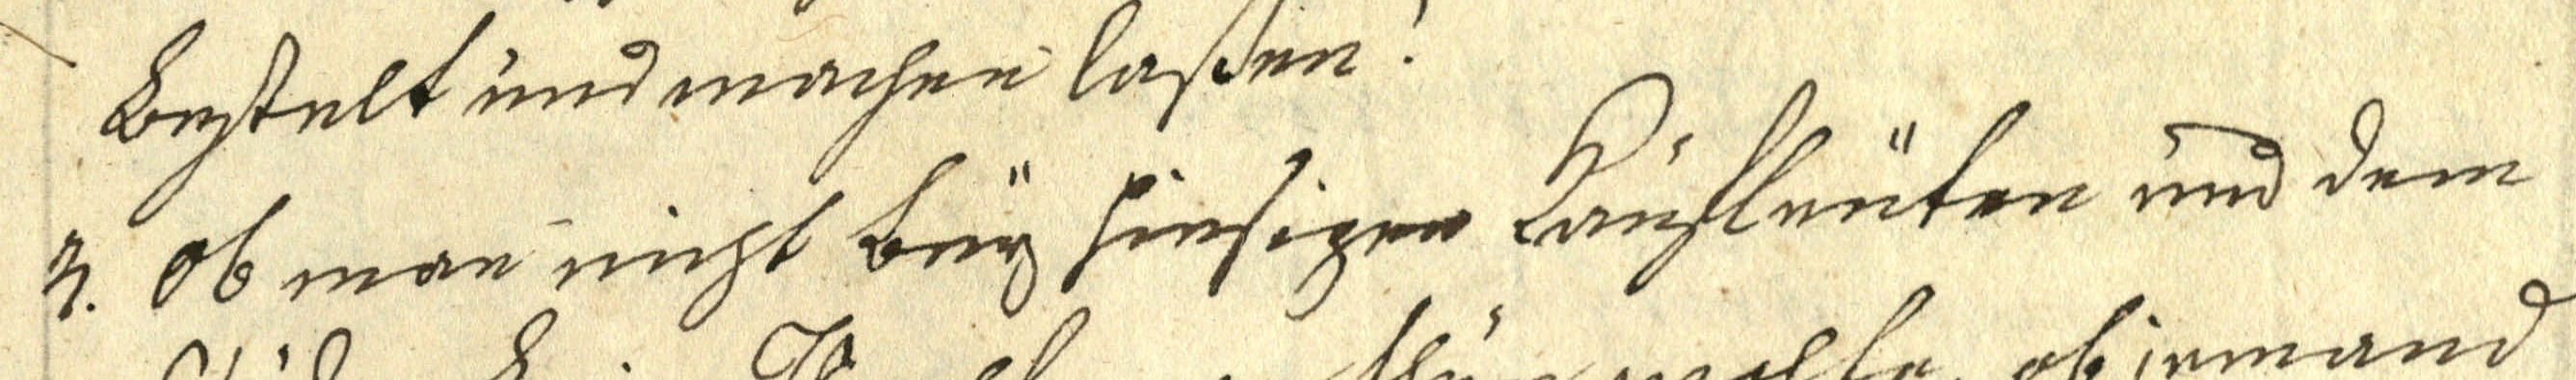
3. Ob man nicht beÿ hiesigen Kaufleuten und dem
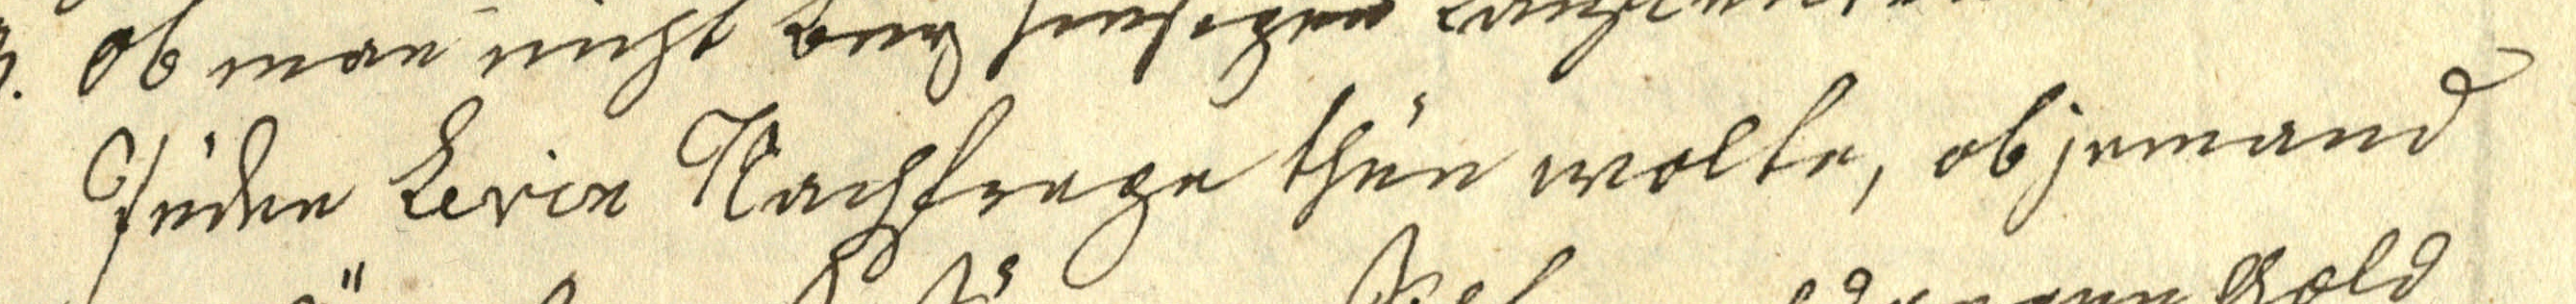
Juden Levin Nachfrage thun wolte, ob jemand
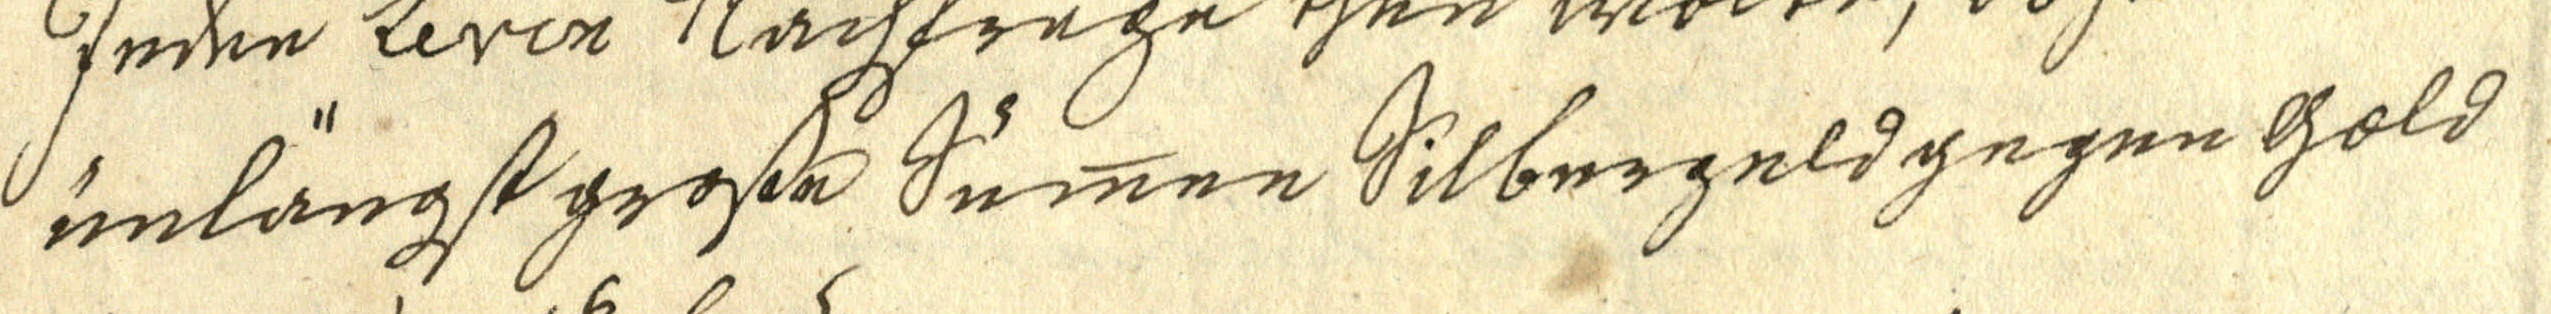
unlängst große Sumen Silbergeld gegen Gold
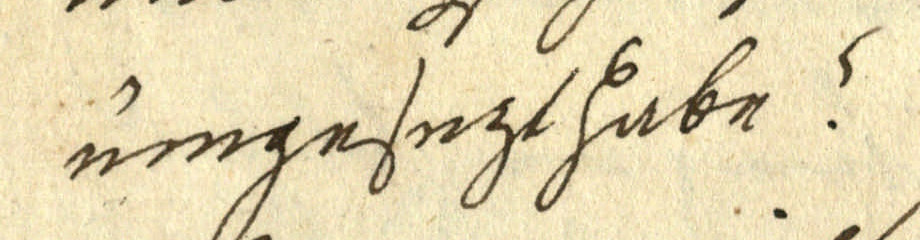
umgesezt habe?
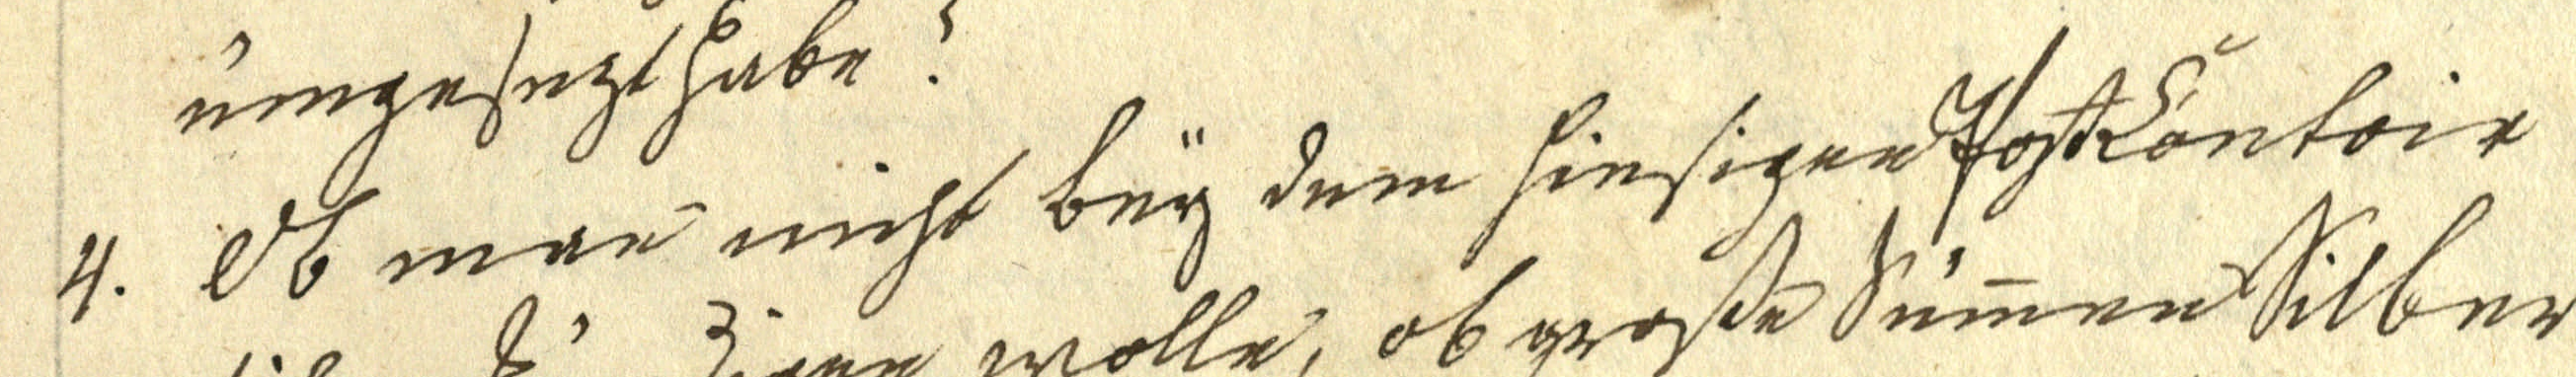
4. Ob man nicht beÿ dem hiesigen PostContoir
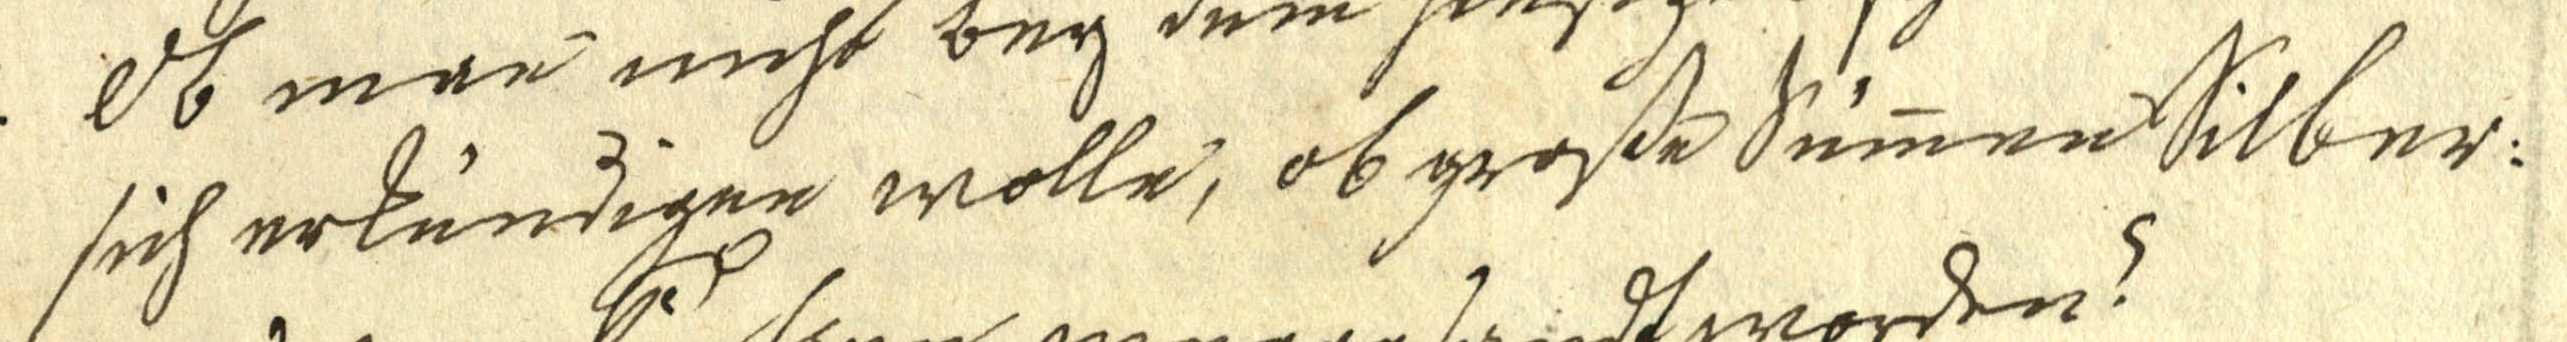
sich erkundigen wolle, ob große Sumen Silber¬
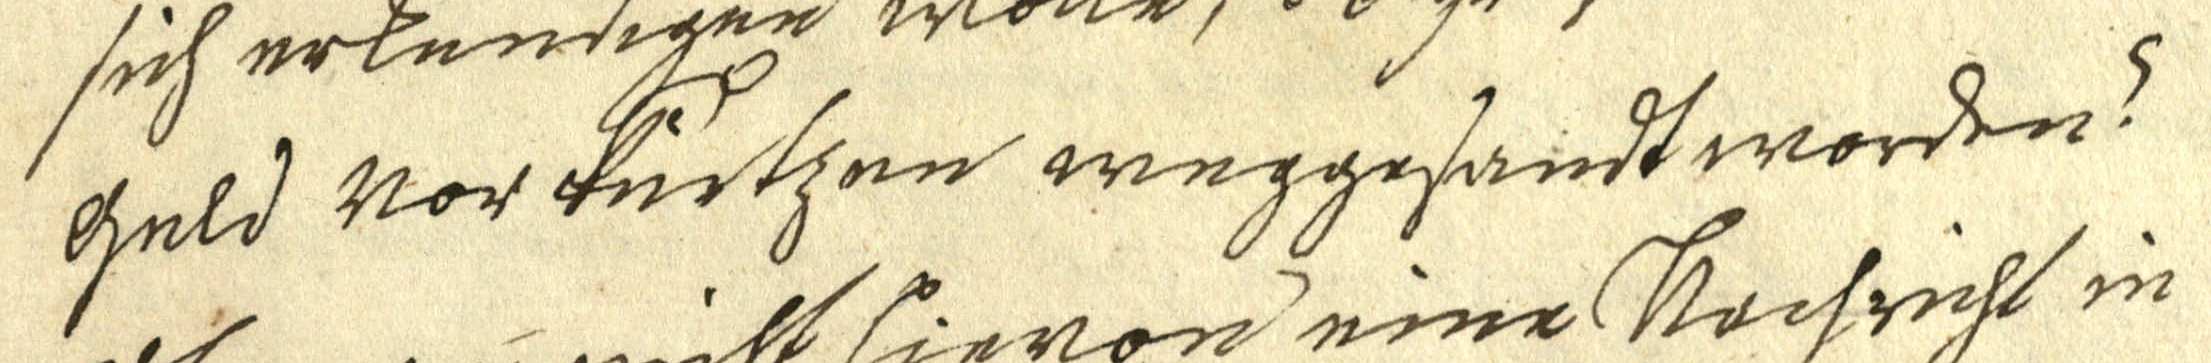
Geld vor kurtzem weggesandt worden?
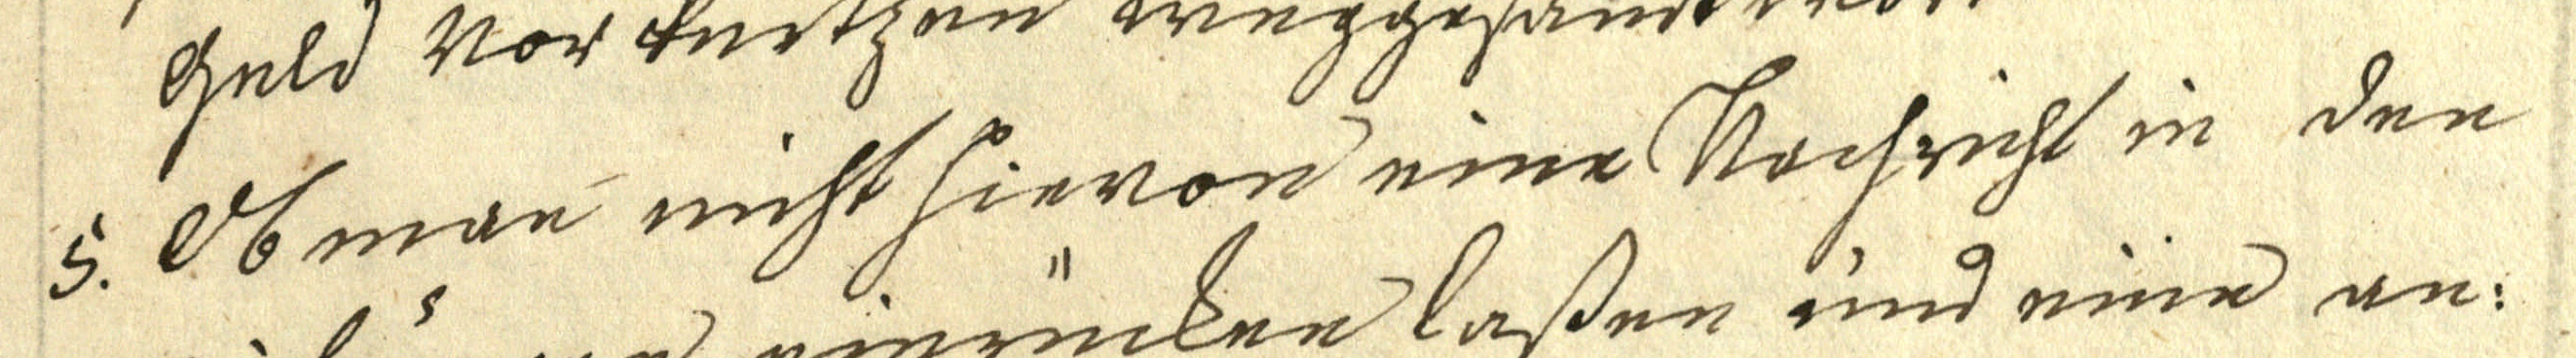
5. Ob man nicht hievon eine Nachricht in den
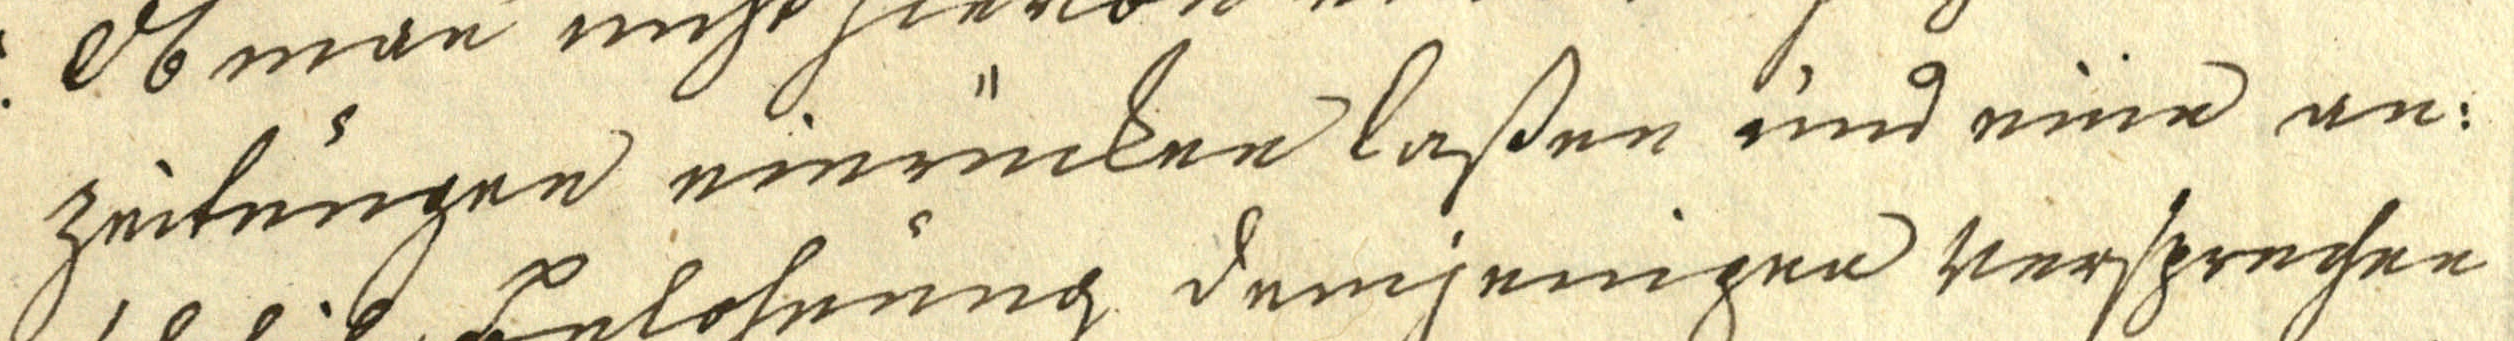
Zeitungen einrücken laßen und eine an¬
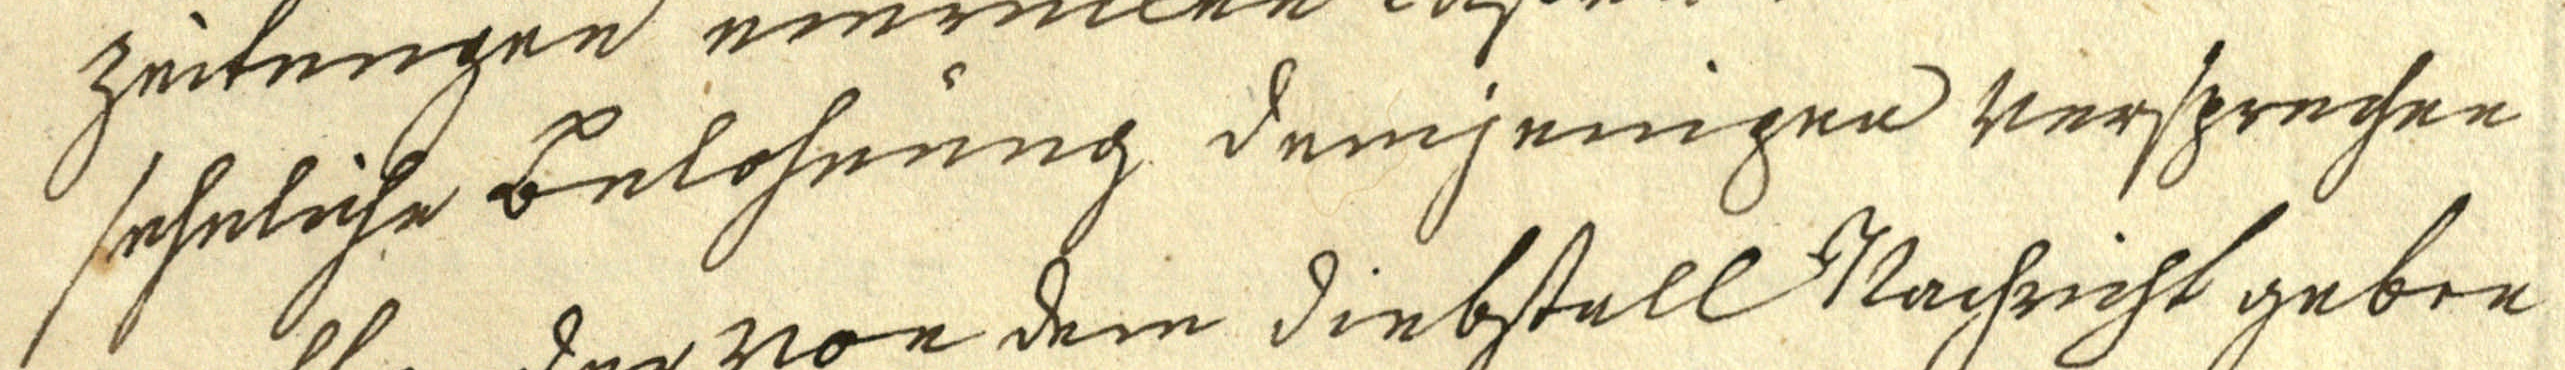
sehnliche Belohnung demjenigen versprechen
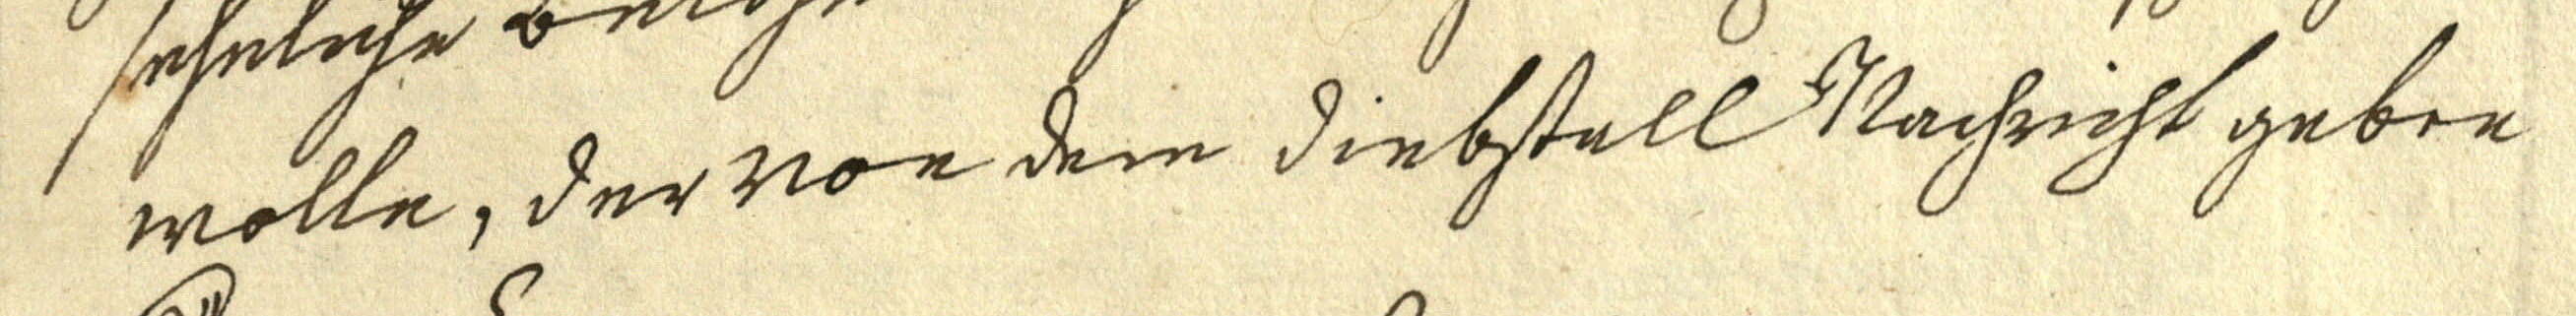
wolle, der von dem Diebstall Nachricht geben
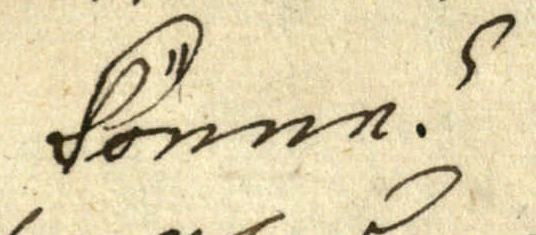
könne?
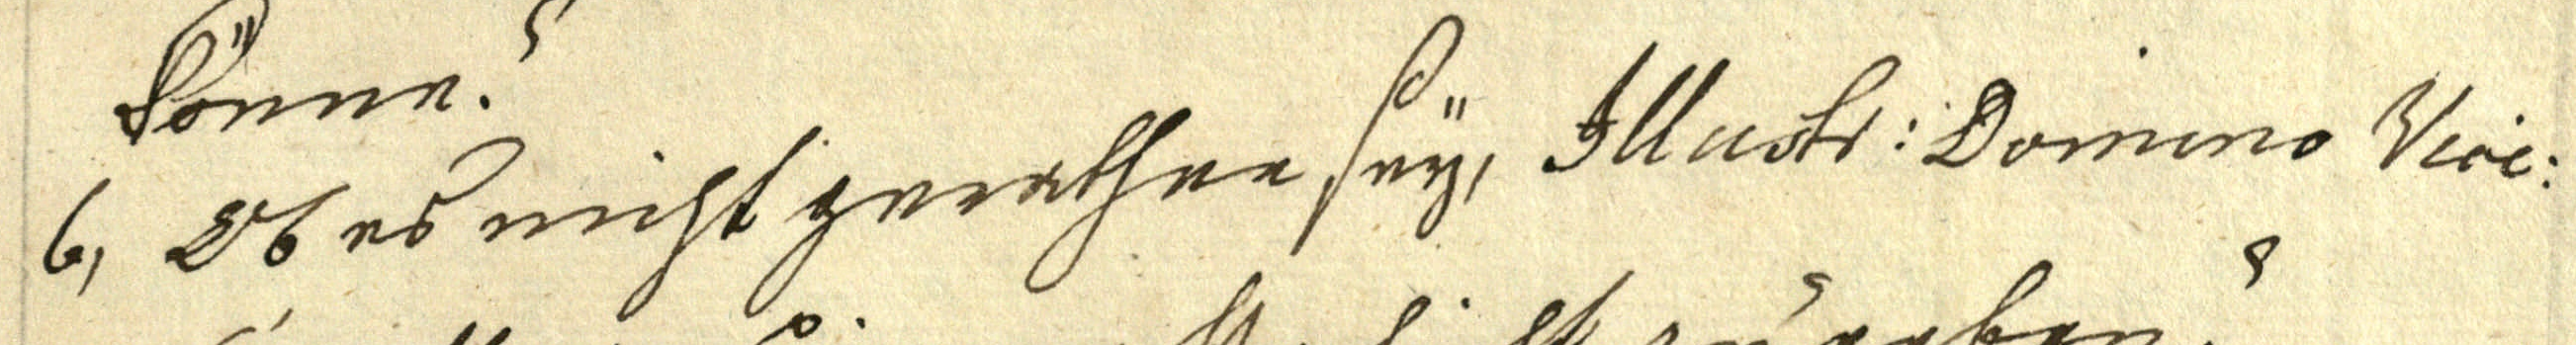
6, Ob es nicht gerathen seÿ, Illustr. Domino Vice¬
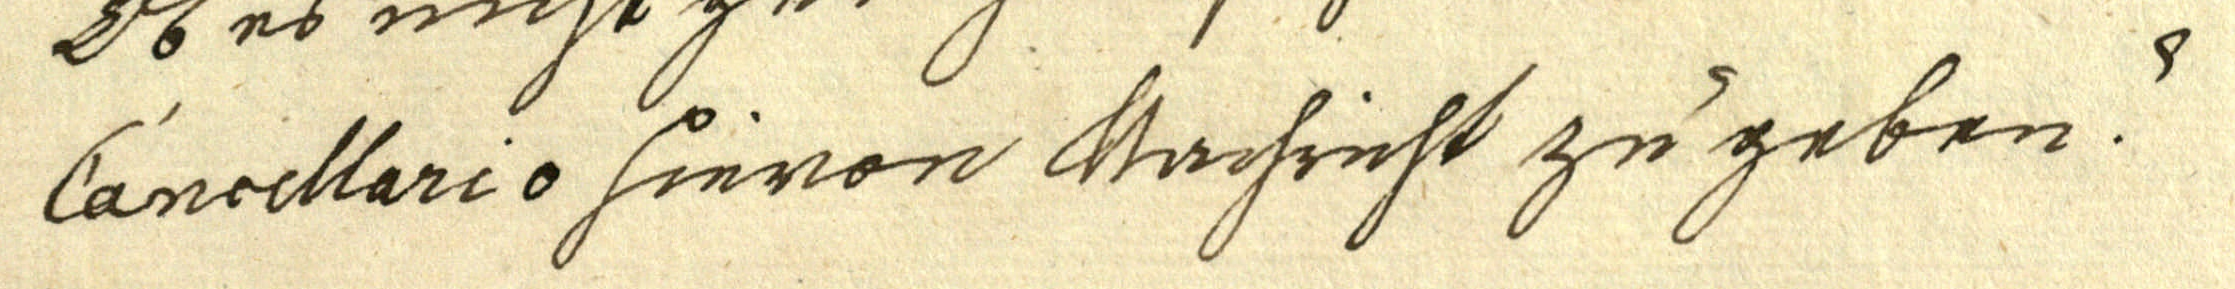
Cancellario hievon Nachricht zu geben?
